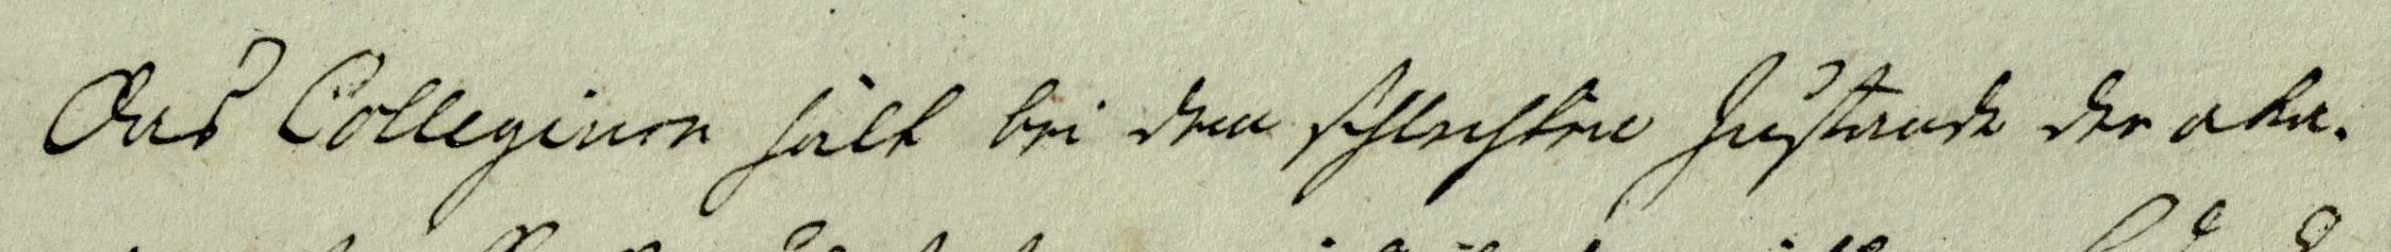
Das Collegium hält bei dem schlechten Zustande der aka¬
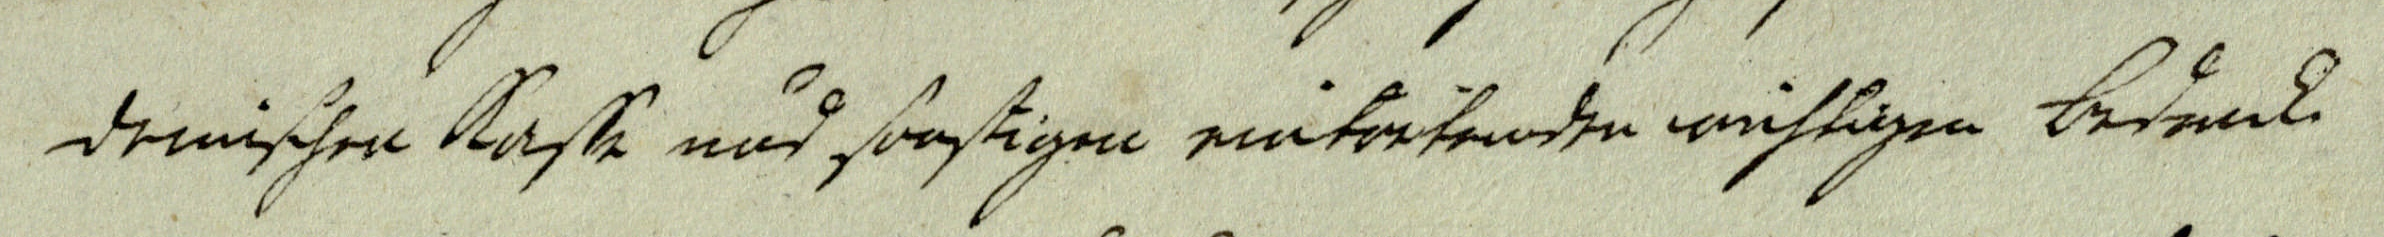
demischen Kasse und sonstigen eintretenden wichtigen Bedenk¬
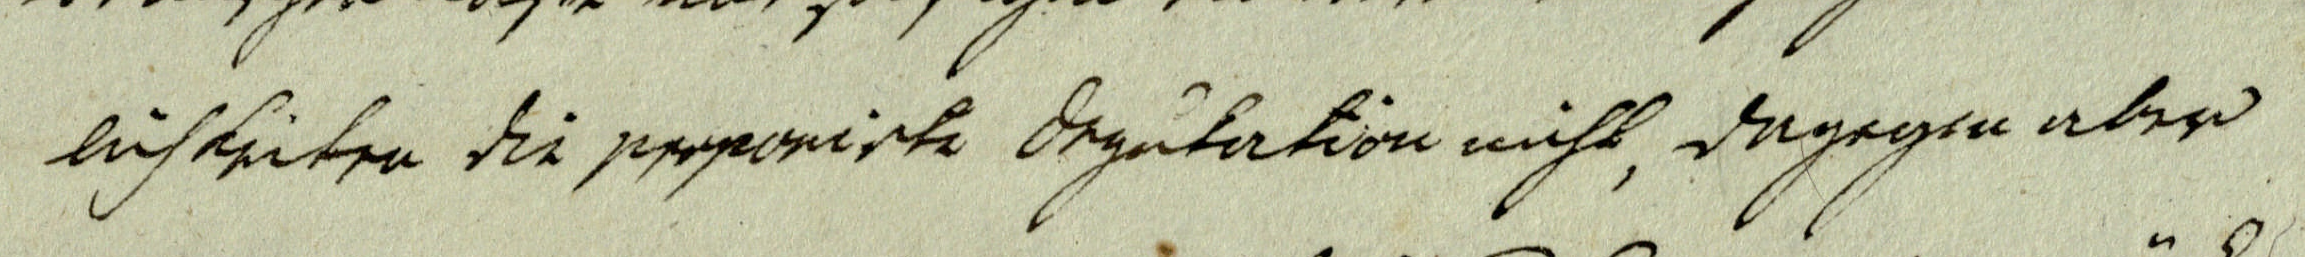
lichkeiten die proponirte Deputation nicht, dagegen aber
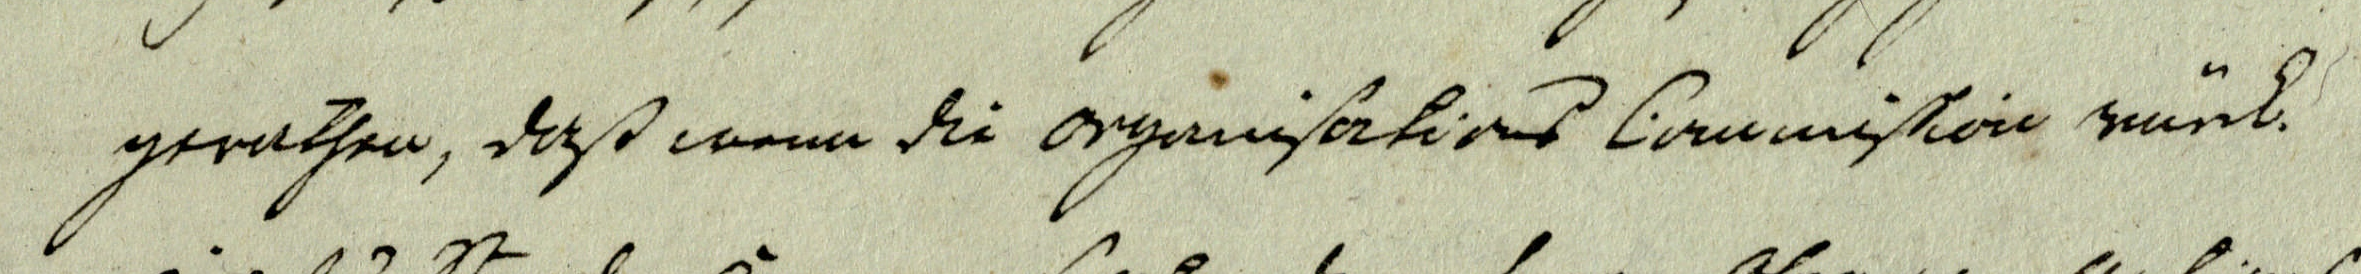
gerathen, daß wenn die Organisations Commission würk¬
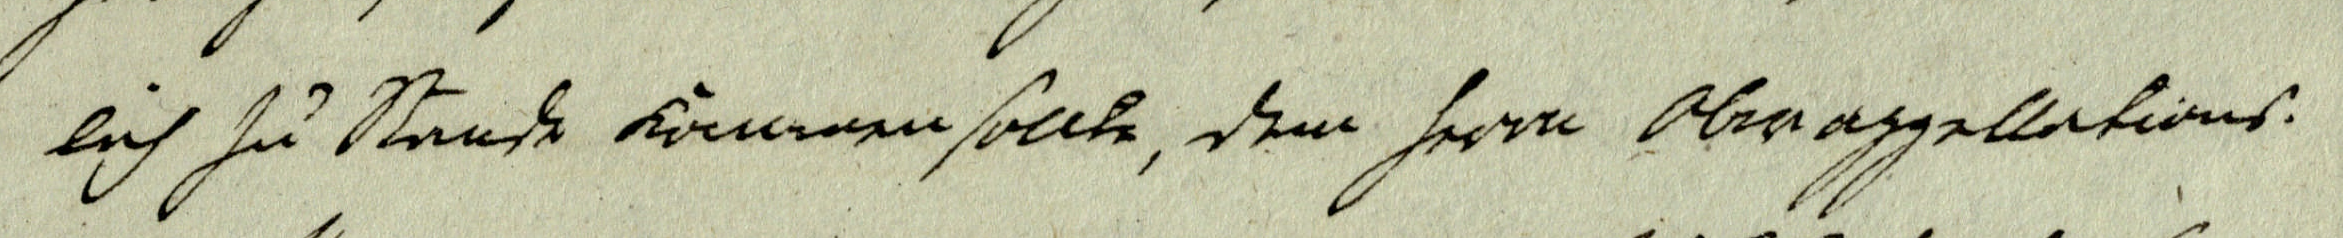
lich zu Stande kommen sollte, dem Herrn Oberappellations¬
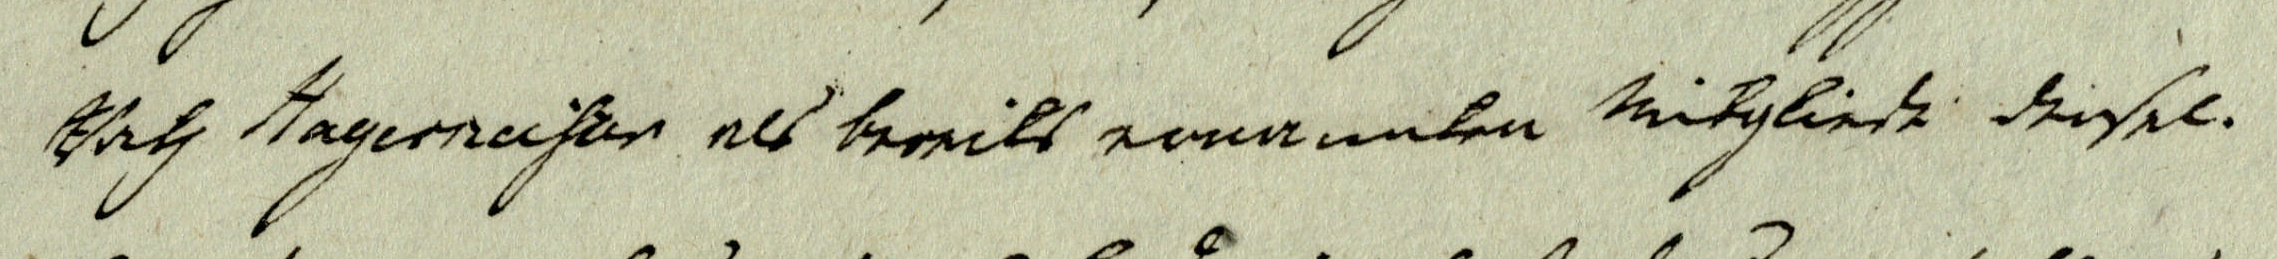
Rath Hagemeister als bereits ernannten Mitgliede dersel¬
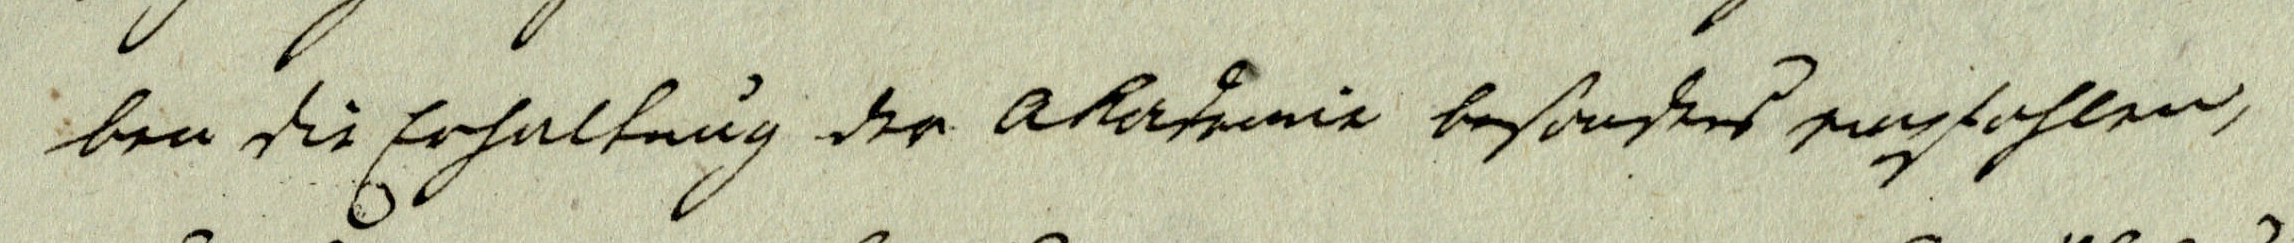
ben die Erhaltung der Akademie besonders empfohlen,
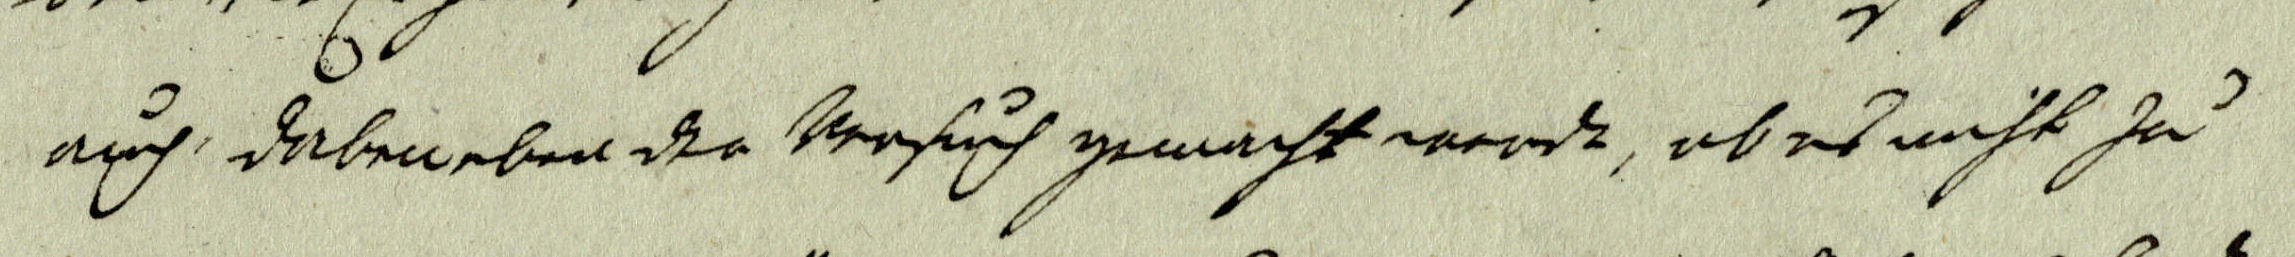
auch dabeneben der Versuch gemacht werde, ob es nicht zu
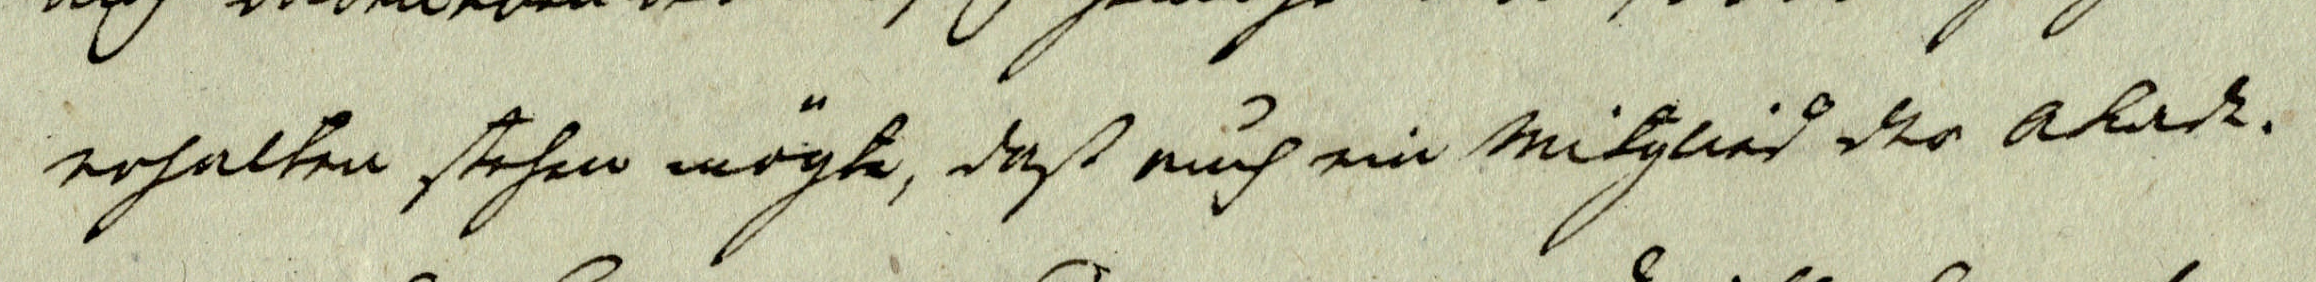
erhalten stehen mögte, daß auch ein Mitglied der Akade¬
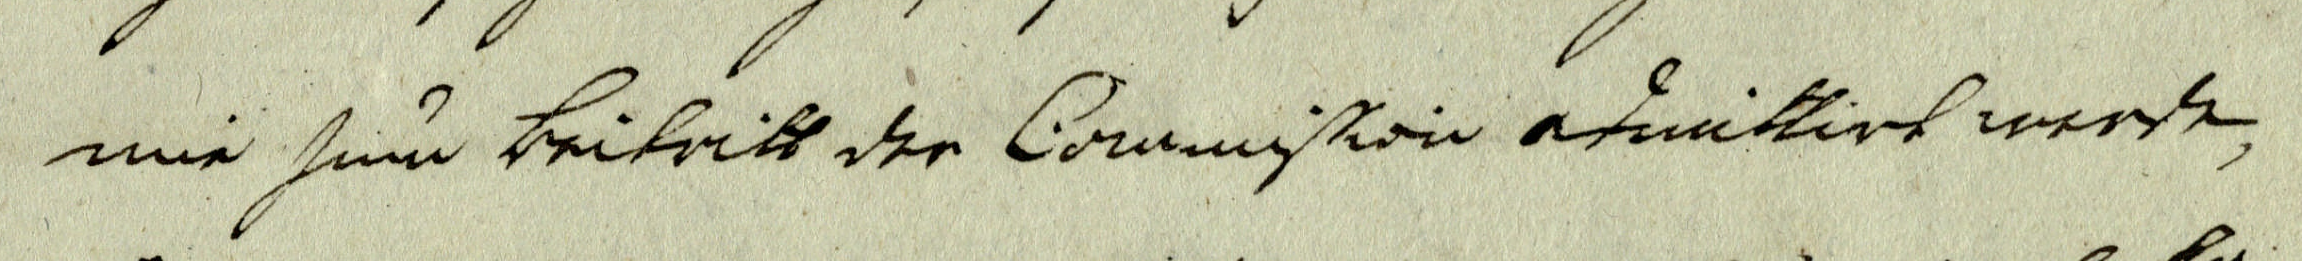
mie zum Beitritt der Commission admittirt werde,
